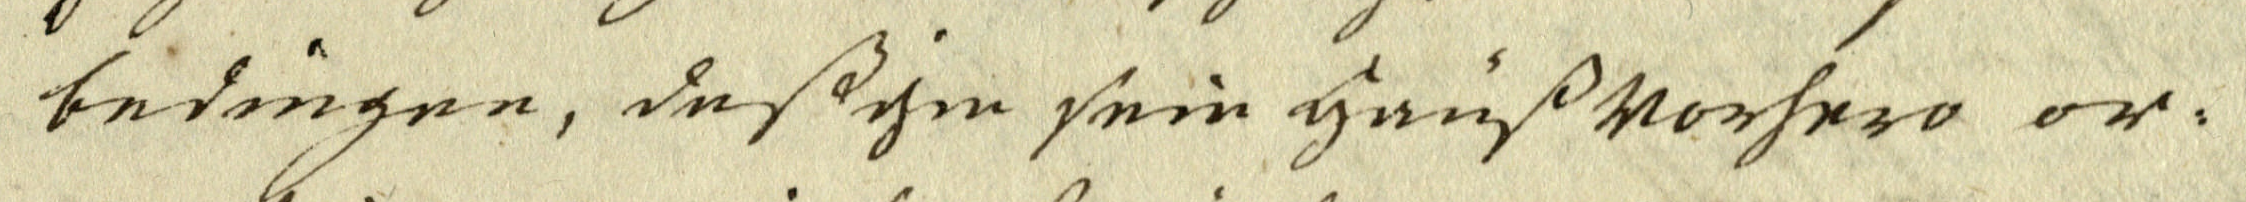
bedingen, daß ihm sein Haus vorhero or¬
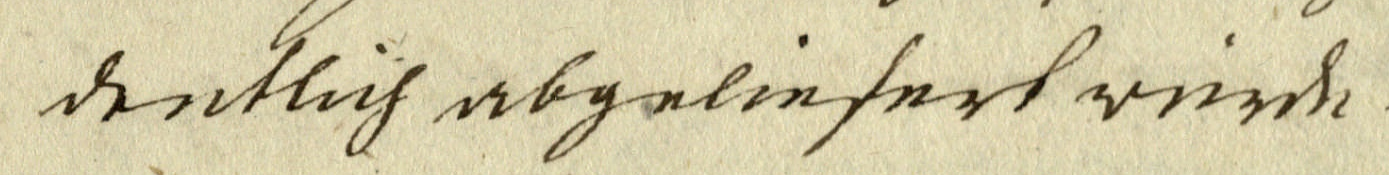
dentlich abgeliefert würde.
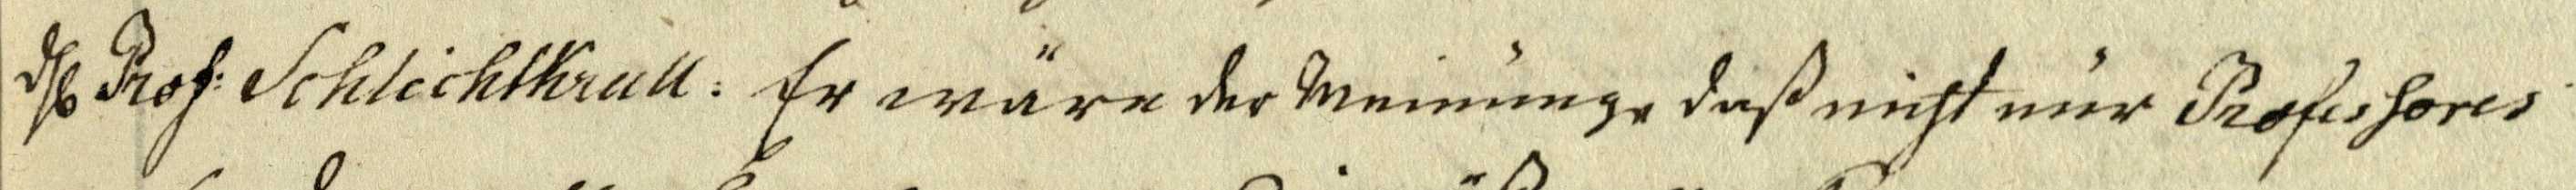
dh. Prof. Schlichtkrull. Er wäre der Meinung, daß nicht nur Professores
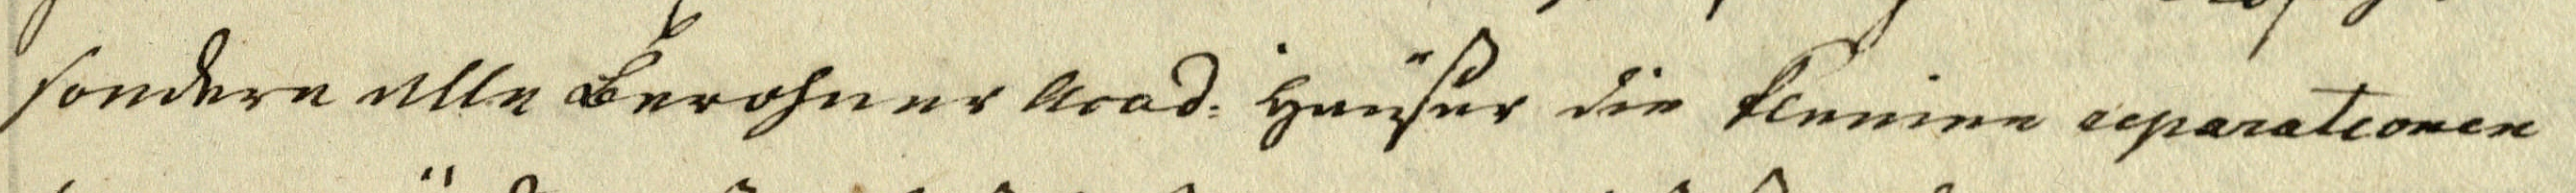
sondern alle Bewohner Acad. Häußer, die kleinen reparationen
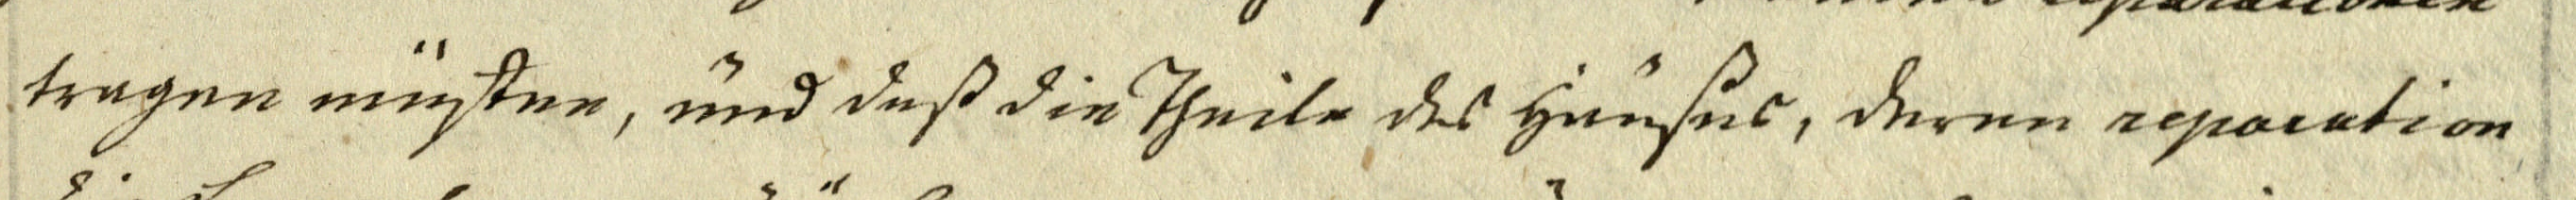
tragen müsten, und daß die Theile des Haußes, deren reparation
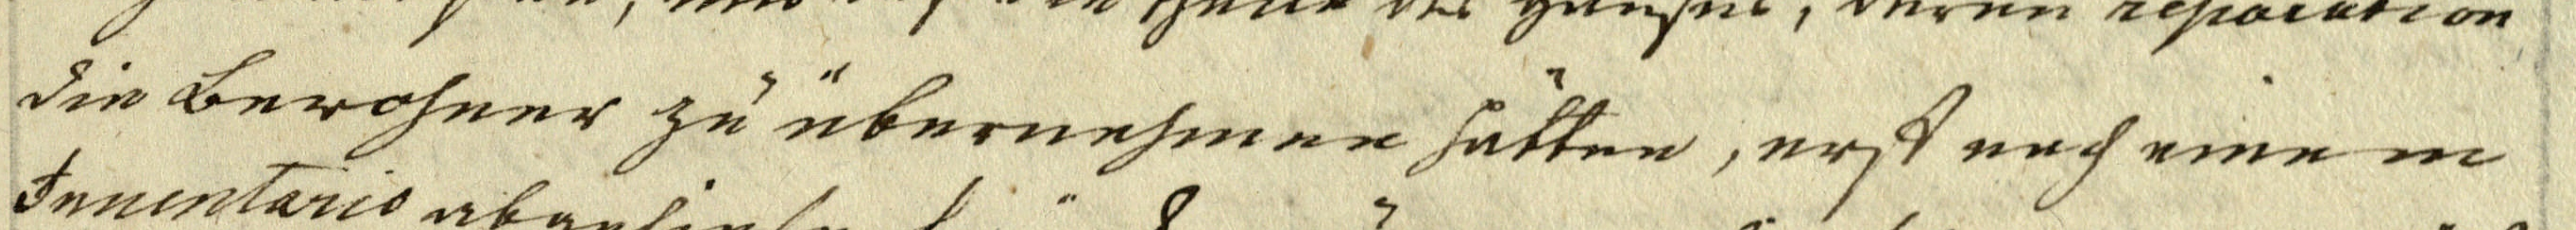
die Bewohner zu übernehmen hätten, erst nach einem
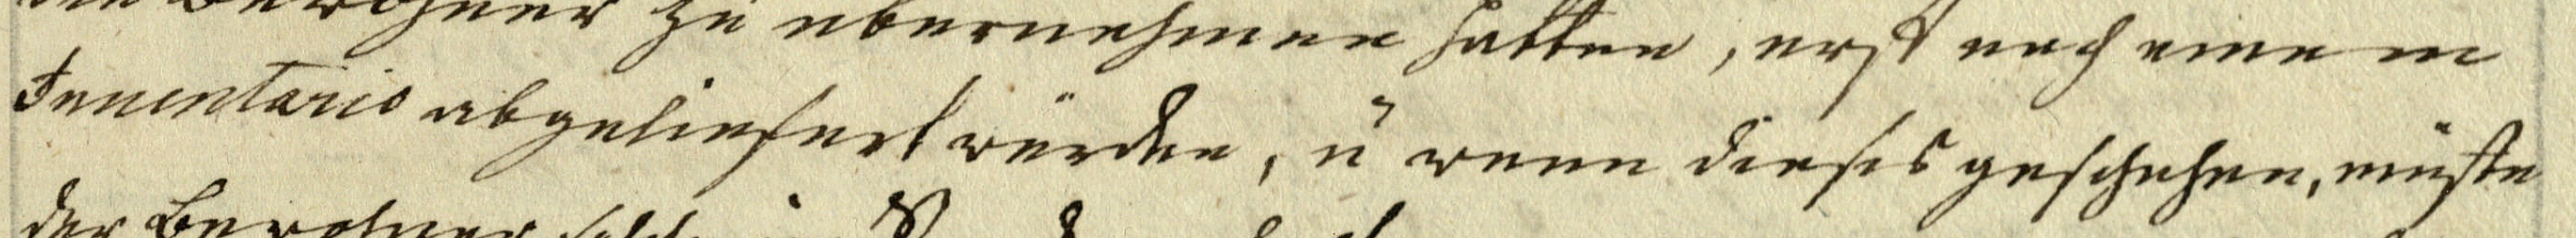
Inventario abgeliefert würden, u wenn dieses geschehen, müste
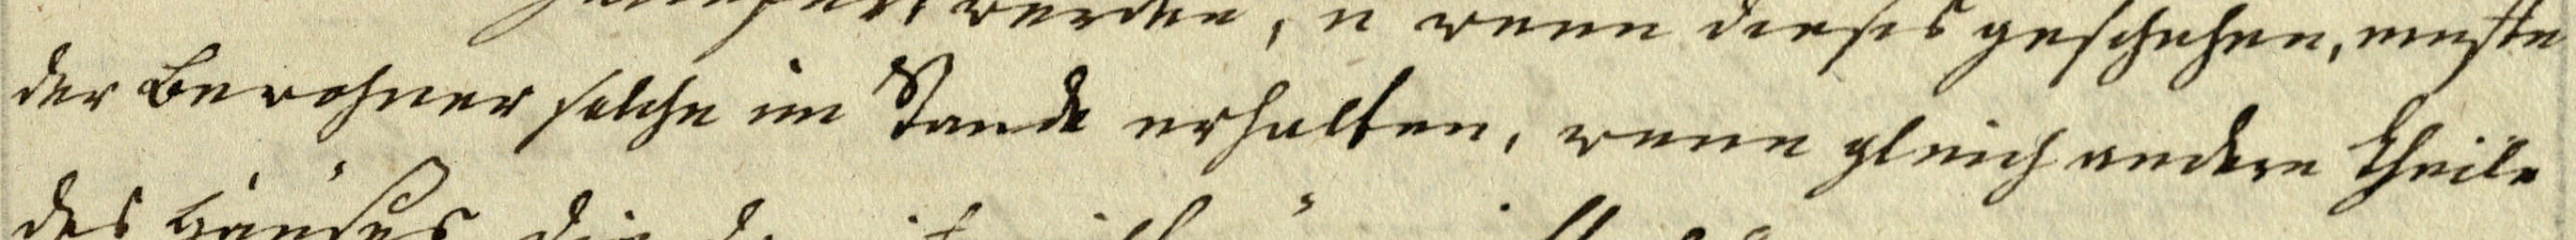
der Bewohner solche im Stande erhalten, wenn gleich andere Theile
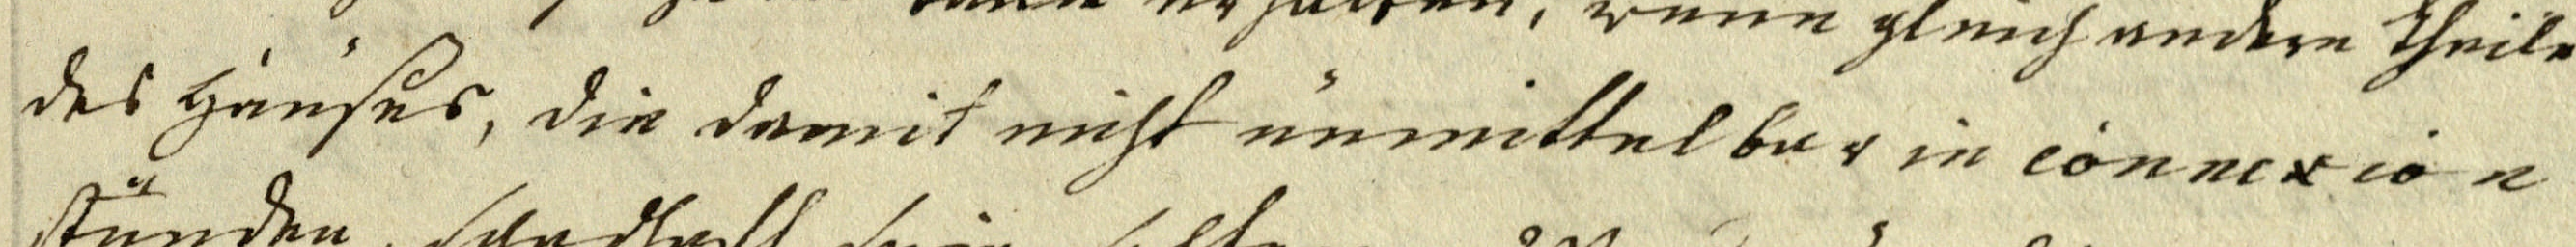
des Haußes, die damit nicht unmittelbar in connexion
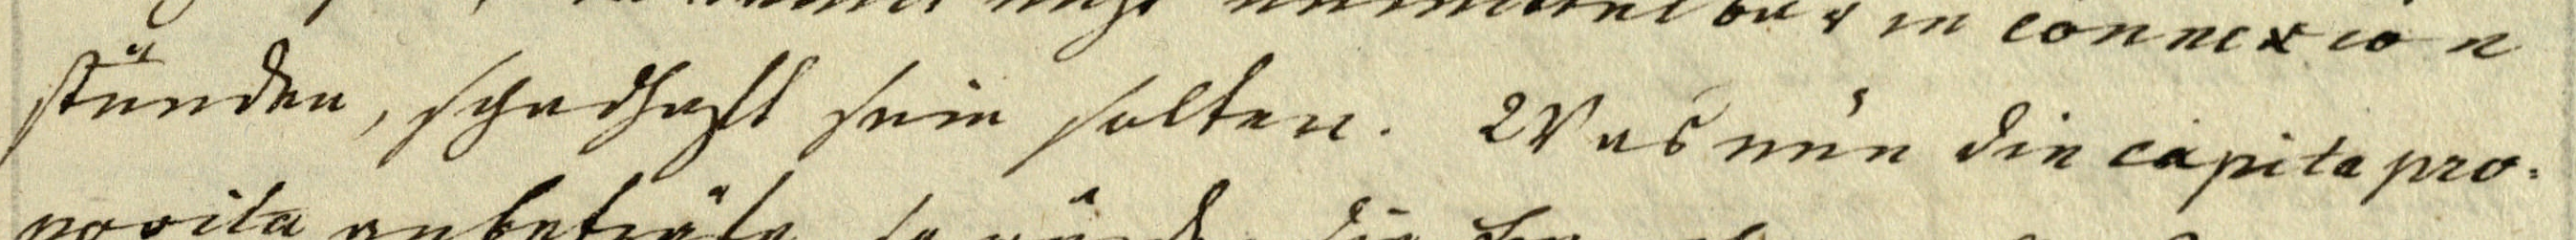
stünden, schadhaft sein solten. Was nun die capita pro¬
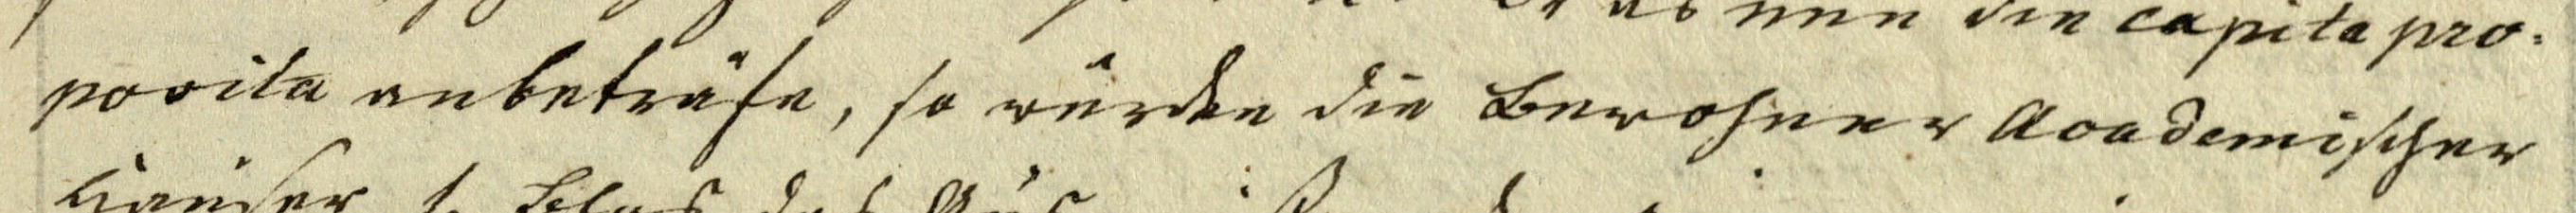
posita anbeträfe, so würden die Bewohner Academischer
